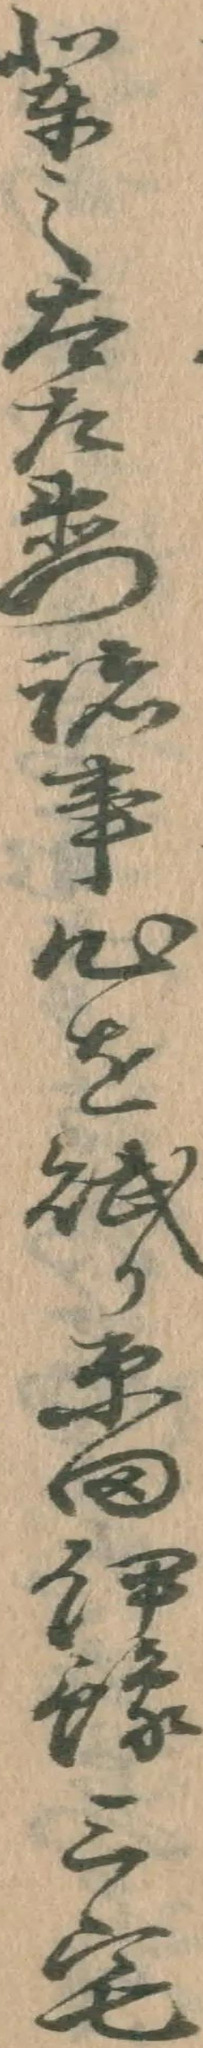輩之太左衛門諸事心を賦り原田伊予三宅
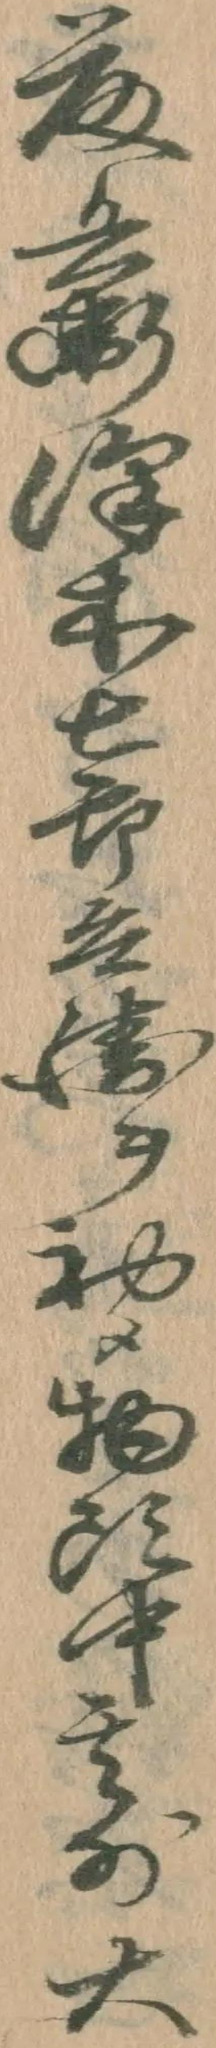藤兵衛沢木七郎兵衛ヲ初メ物頭中其外大
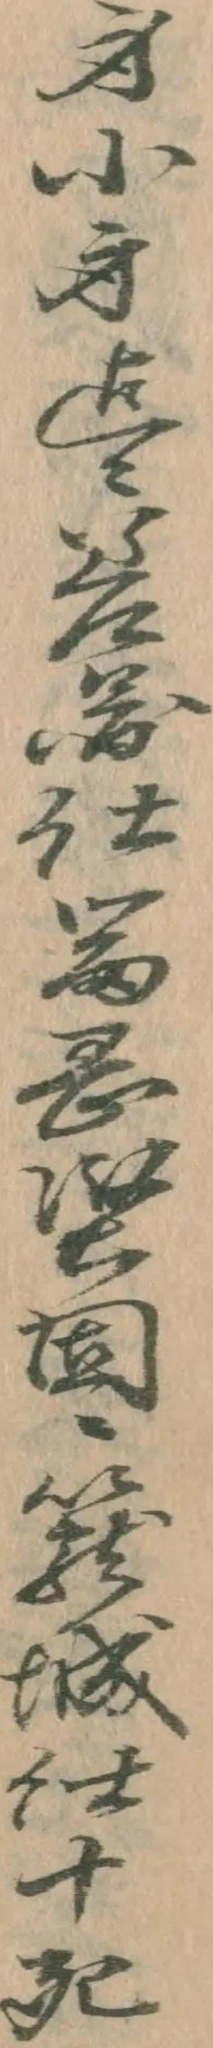身小身迄に差図仕富岡堅固に籠城仕十死
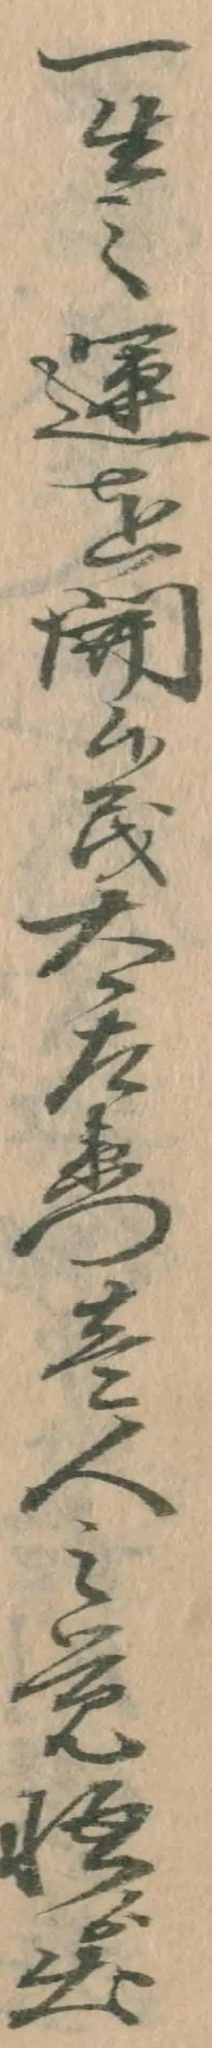一生之運を開候も太左衛門壱人之覚悟ゟ出
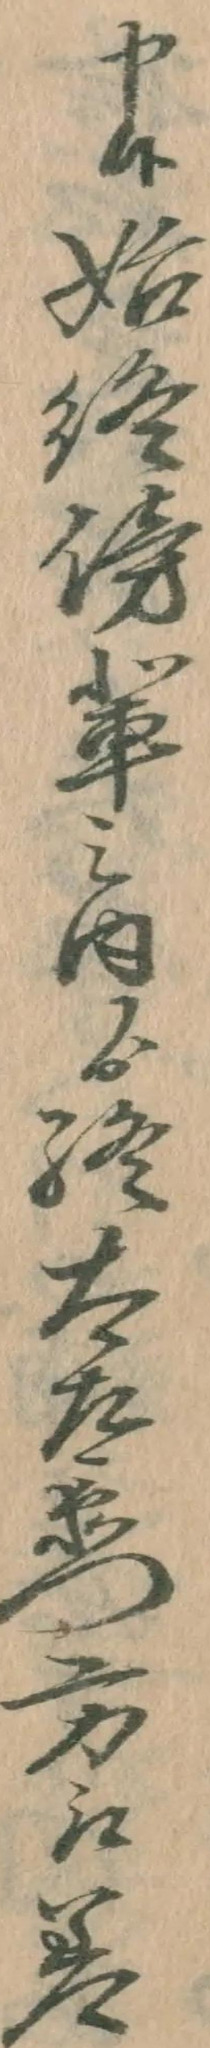申候始終傍輩之内ゟ終太左衛門方江差
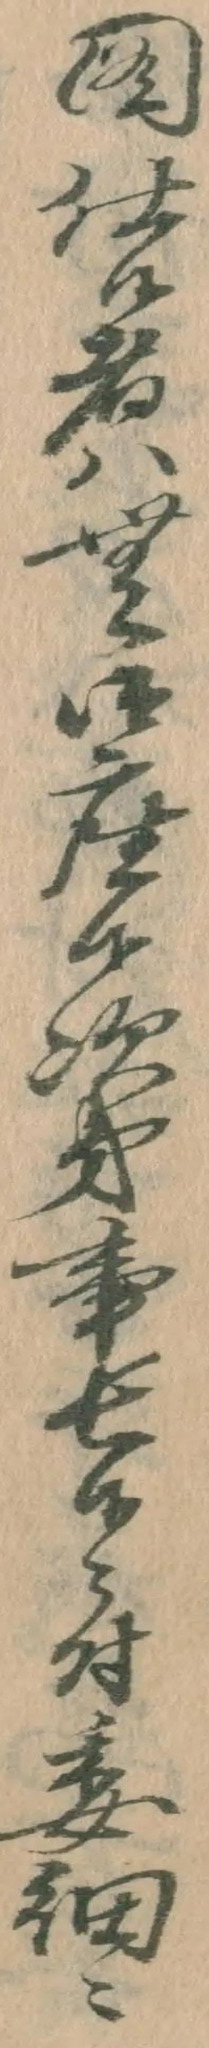図仕候者は無御座候次第事長候に付委細に
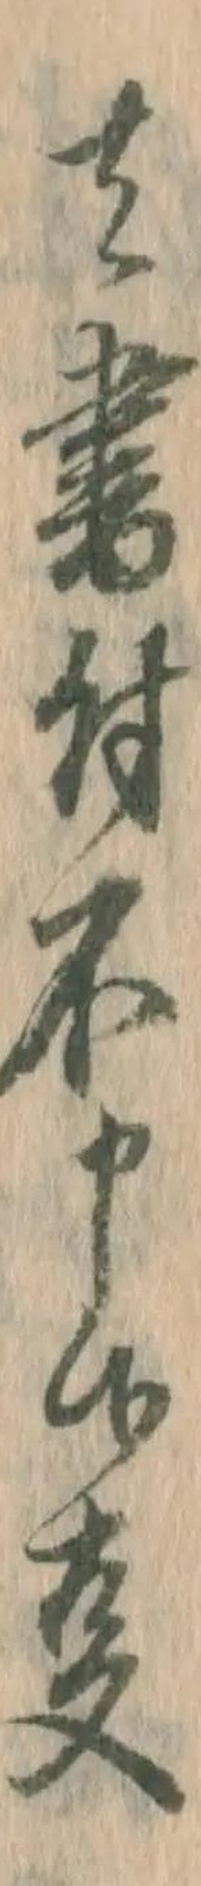は書付不申候事
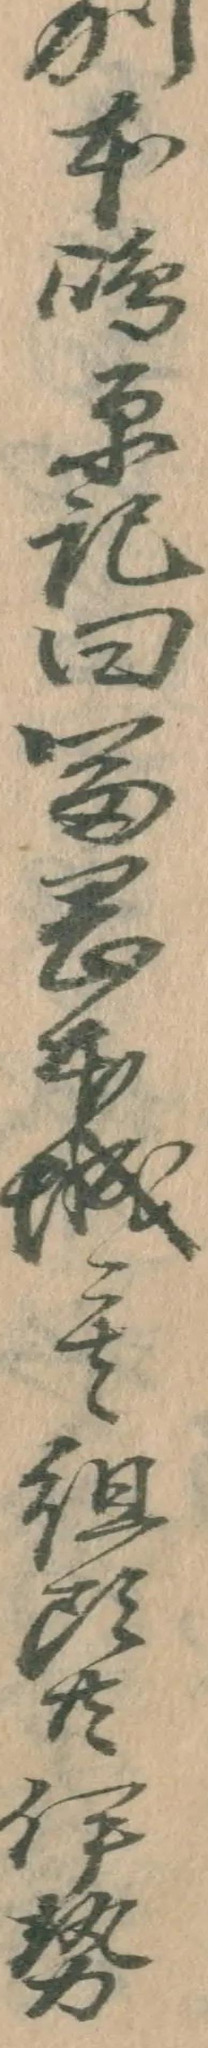別本島原記曰富岡本城には組頭共伊勢
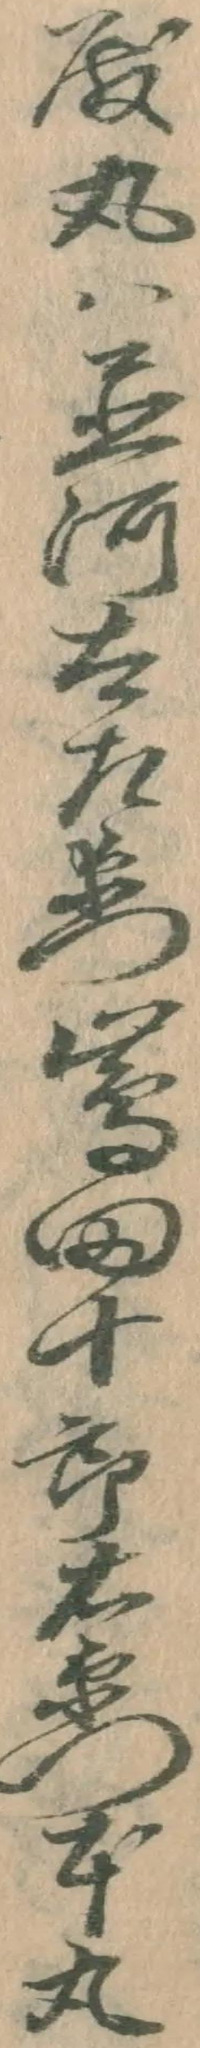殿丸は並河太左衛門島田十郎右衛門本丸
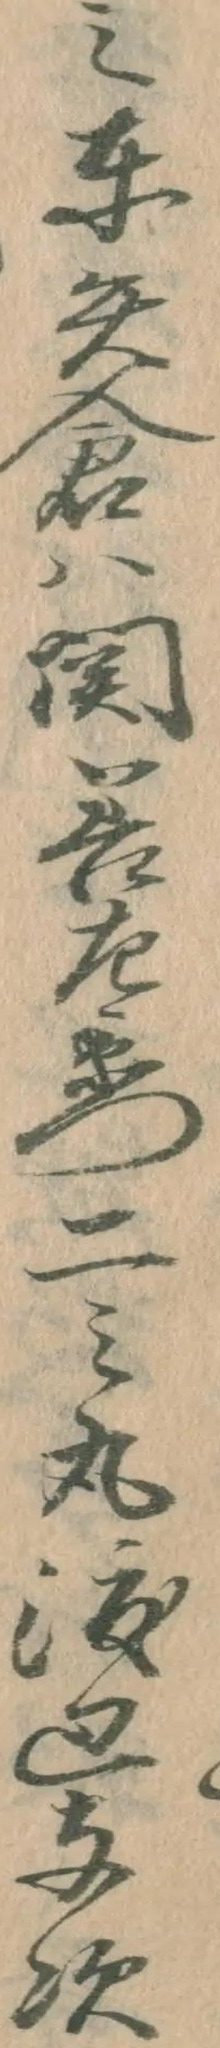之東矢倉は関善左衛門二之丸渡辺与次
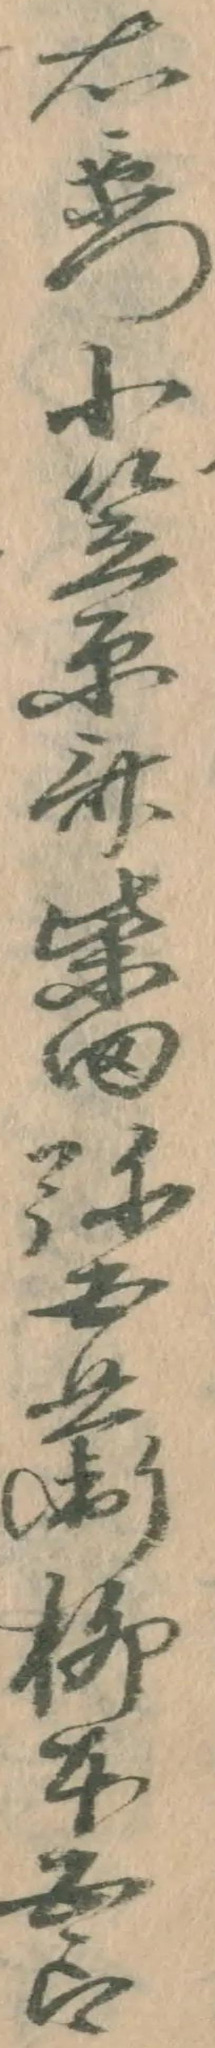右衛門小笠原斎柴田弥五兵衛柳本五郎
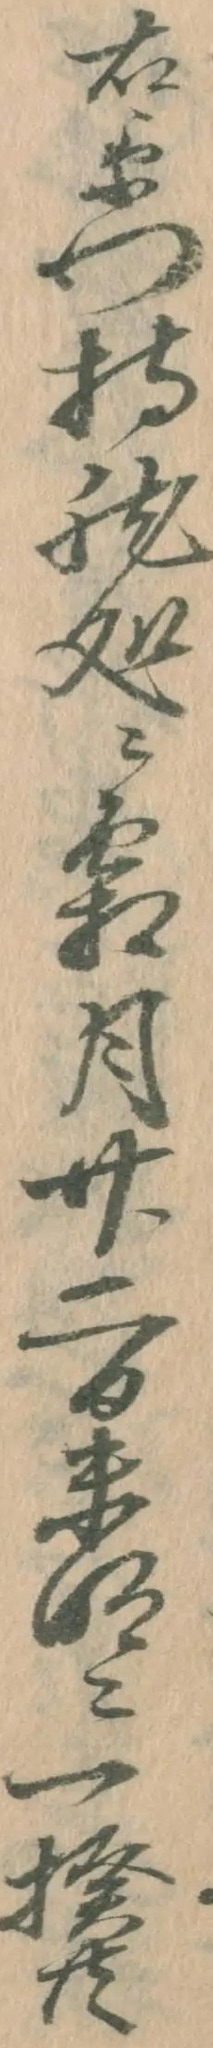右衛門持然処に霜月廿二日未明に一揆共

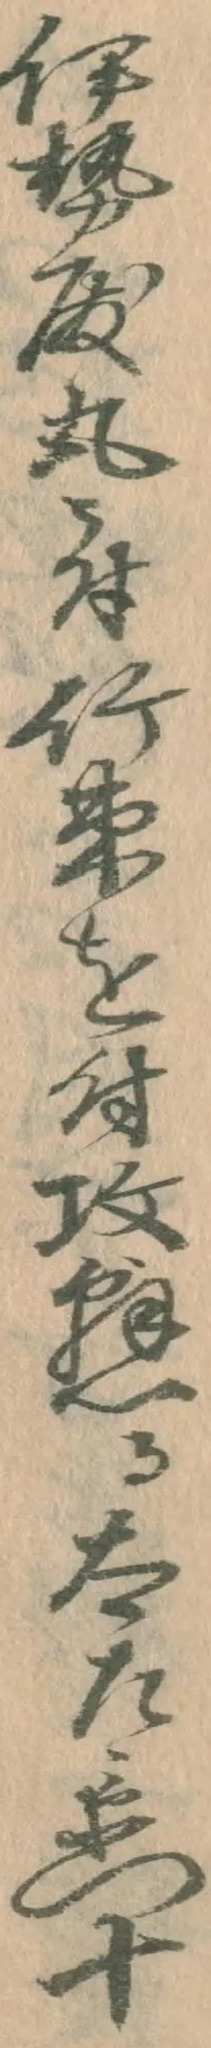伊勢殿丸に付竹束を付攻懸る太左衛門十
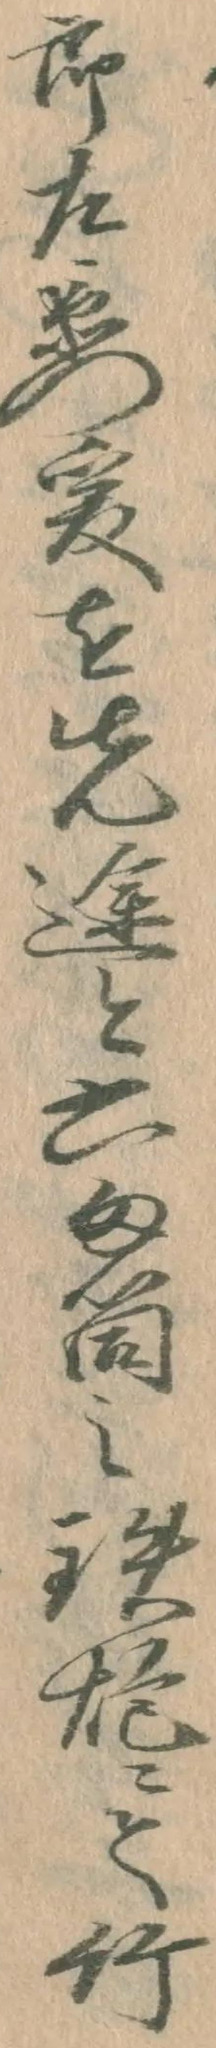郎左衛門爰を先途と六匁筒之鉄炮にて竹
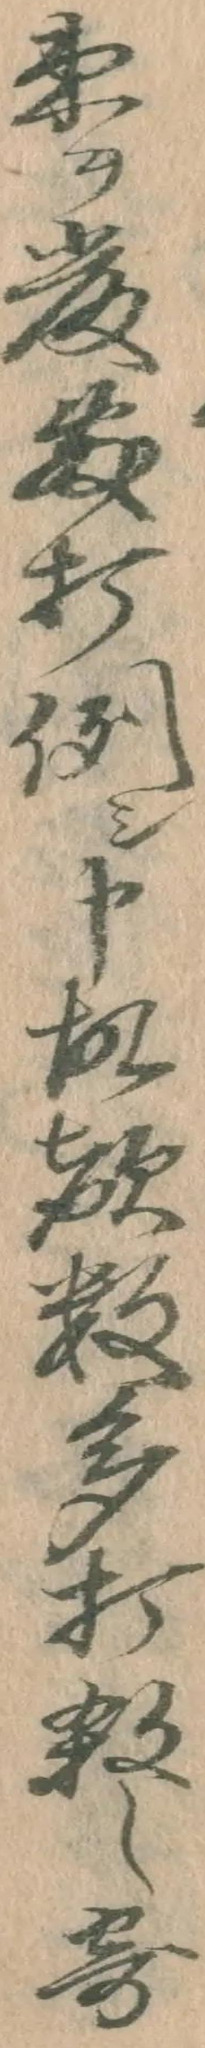束ヲ厳敷打例シ申故敵数多打殺し寄
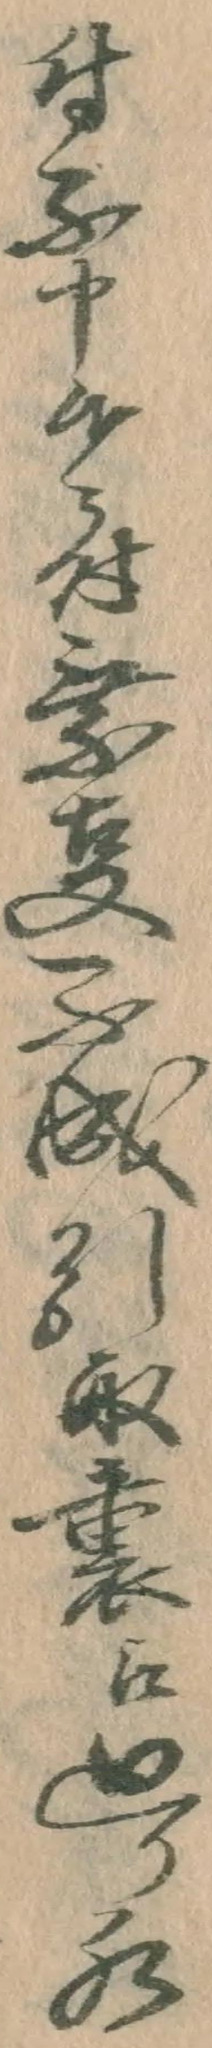付不申候に付乗事不成引取裏江廻り水
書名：切支丹御退治記 49巻. [3]
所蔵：国立国会図書館 National Diet Library, JAPAN
